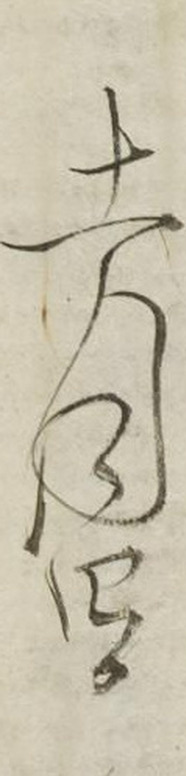十一月四日
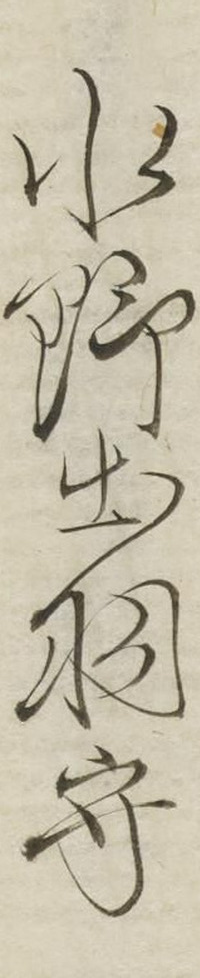水野出羽守
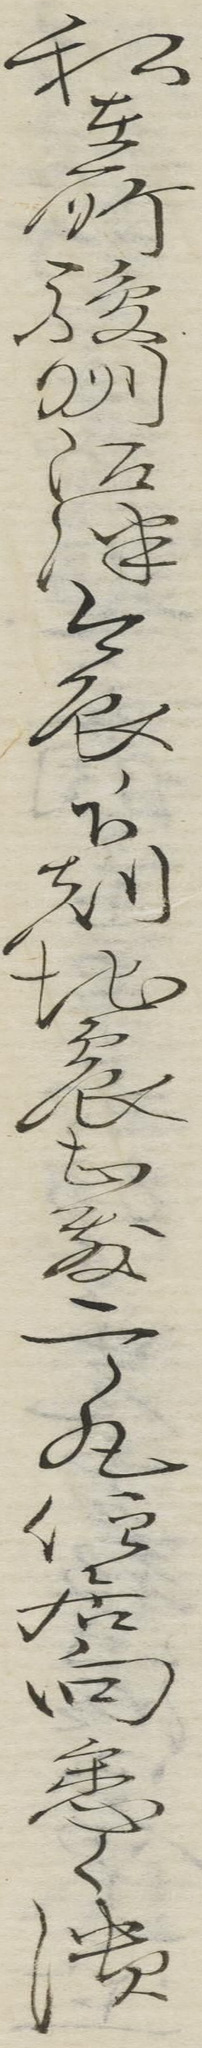私在所駿州沼津今辰ノ下刻地震甚敷二ノ丸住居向悉く潰
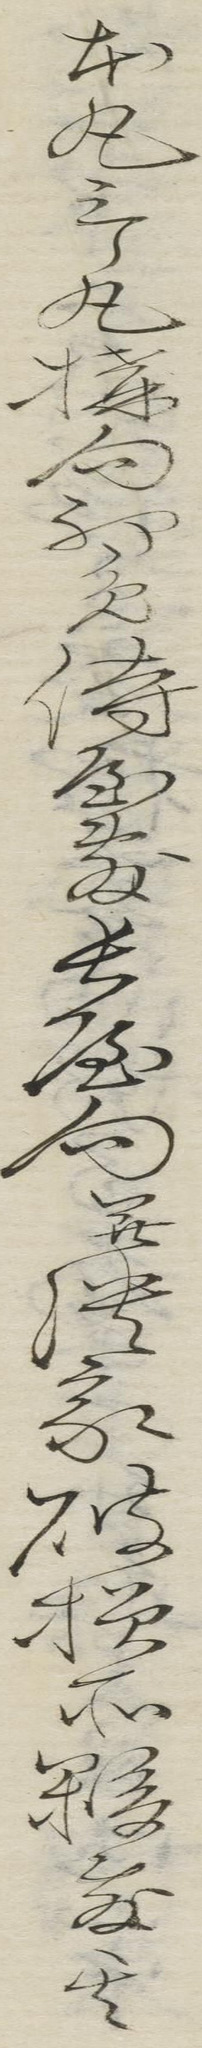本丸三ノ丸構向き初め侍屋敷長屋向幷潰家破損所夥敷其
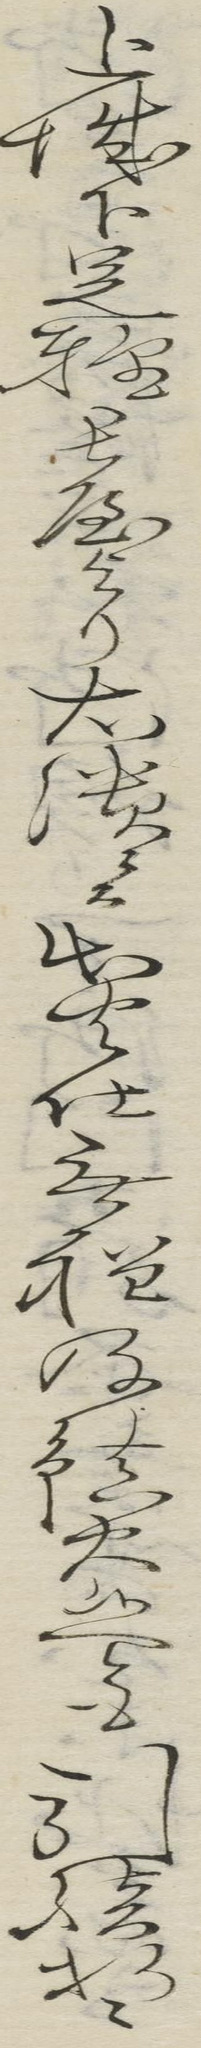上城下足軽長屋より右潰ニ而出火仕無程の鎮火候へとも引続折々
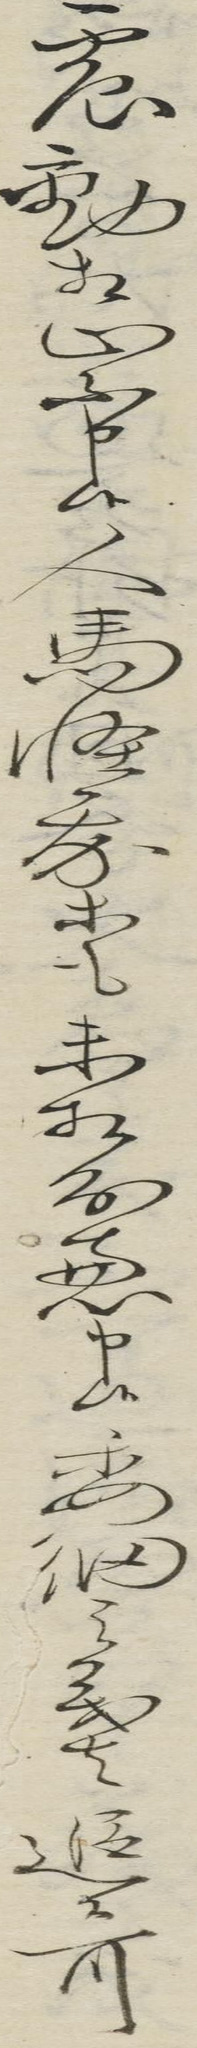震動相止不申候人馬怪我等も未相分兼申候委細之義は追而可
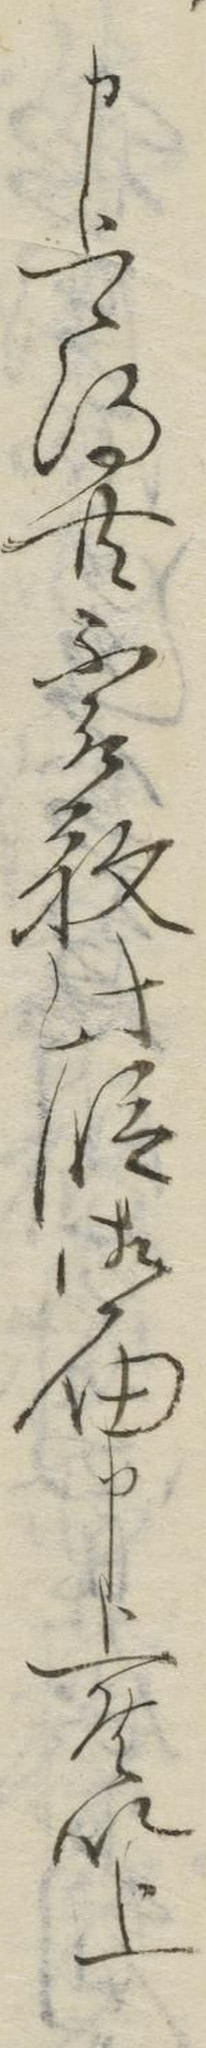申上候得共不取敢此段御届申上候以上
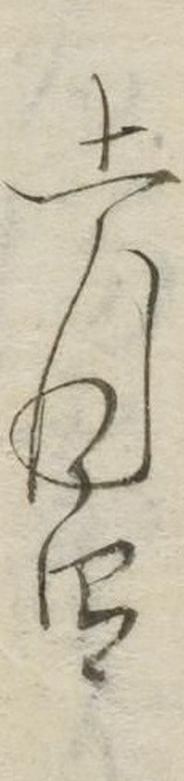十一月四日
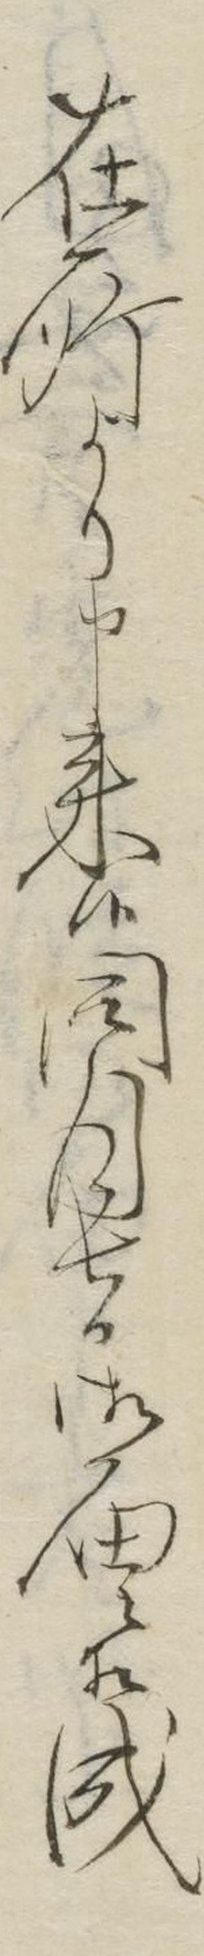在所より申来候同月七日御届ニ相成
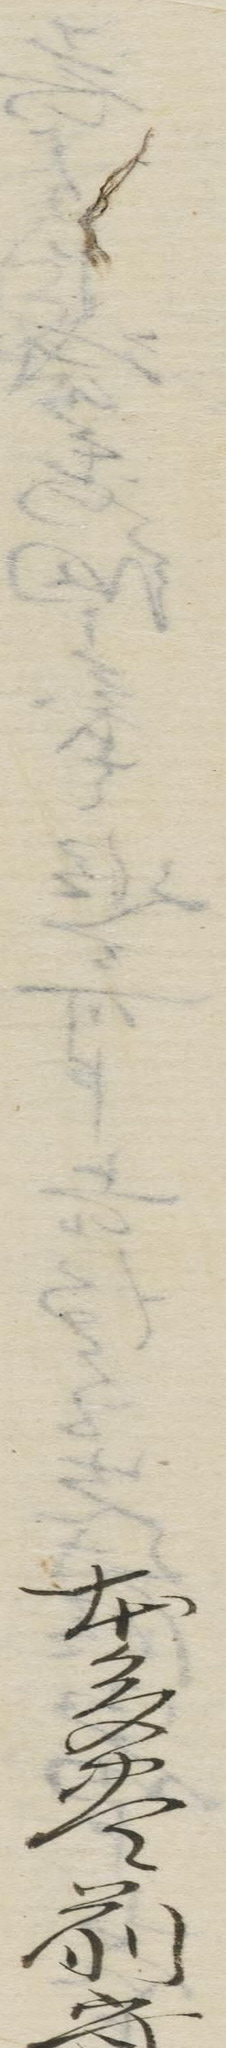本多豊前守
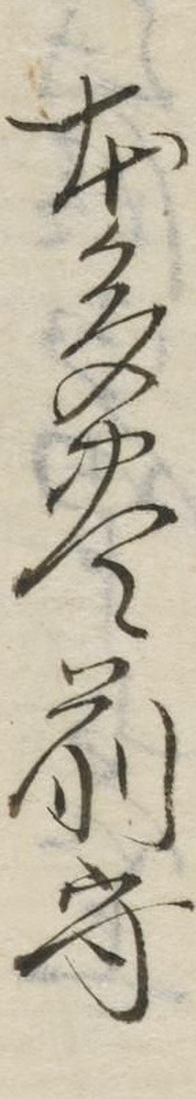本多豊前守
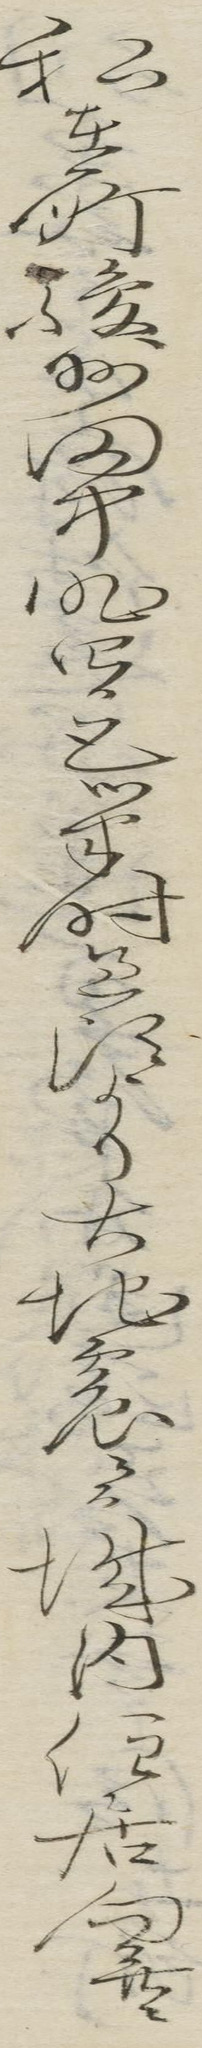私在所駿州田中昨四日五ツ半時過頃より大地震ニ而城内住居向幷ニ
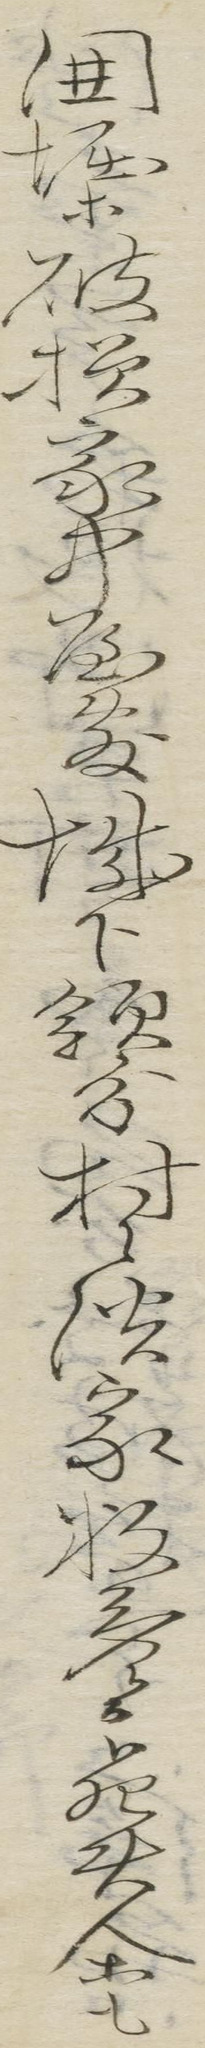囲堀等破損家中屋敷城下領分村々潰家数多ニ而死失人等も
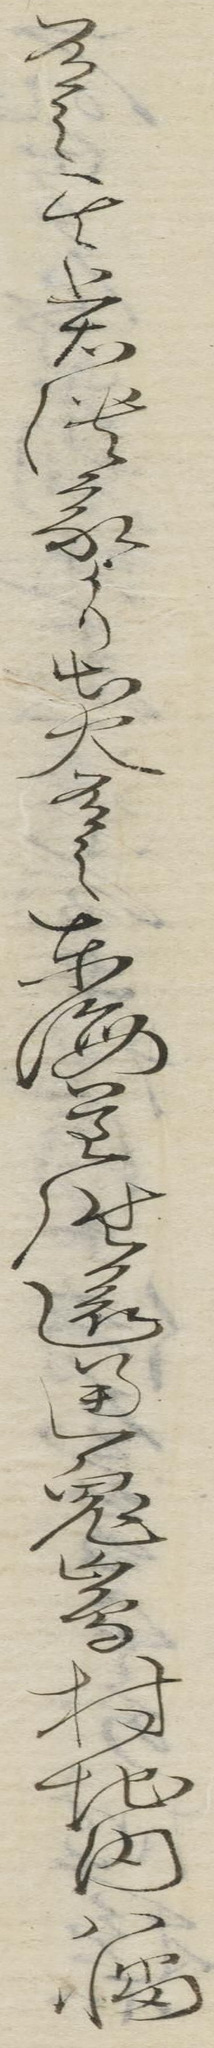有之其上右潰家より出火有之東海道往還通鬼嶌村地内八幡
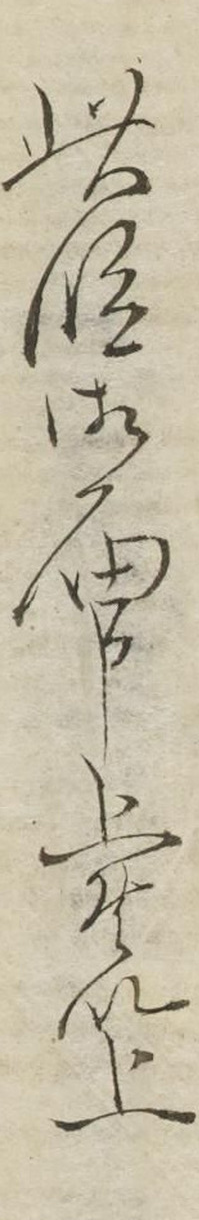此段御届申上候以上

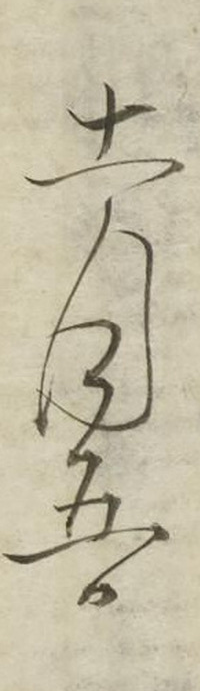十一月五日
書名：大地震實録
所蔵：東京大学地震研究所図書室 Earthquake Research Institute Library, The University of Tokyo, JAPAN
